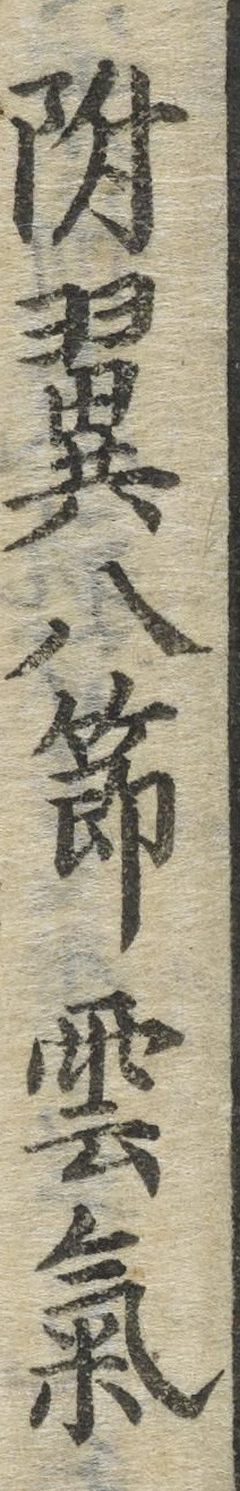附翼八節雲気
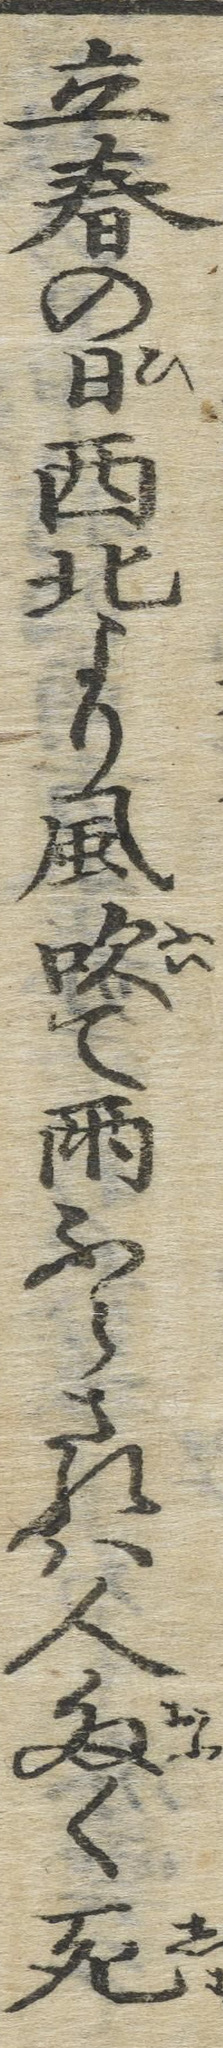立春の日西北より風吹て雨ふらされは人多く死
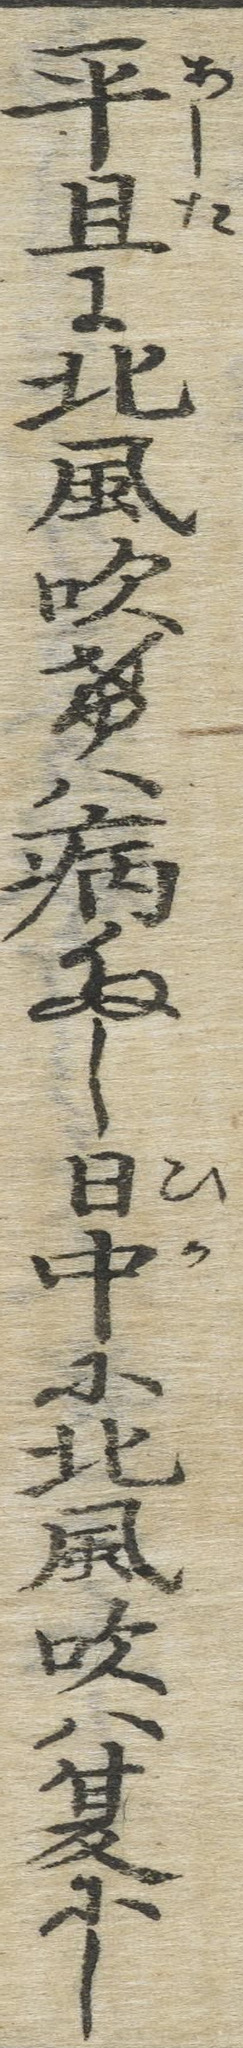平且に北風吹けは病多し日中に北風吹は夏にし
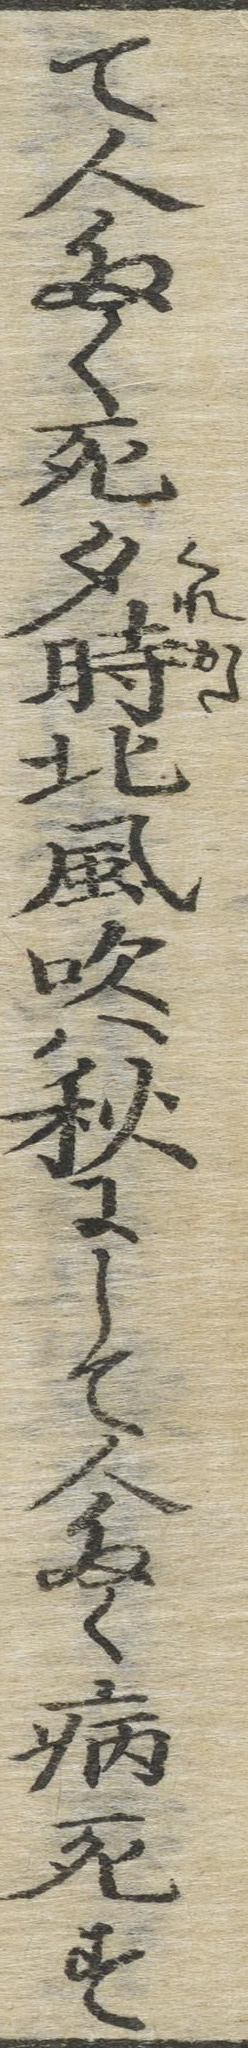て人多く死夕時北風吹は秋にして人多く病死す
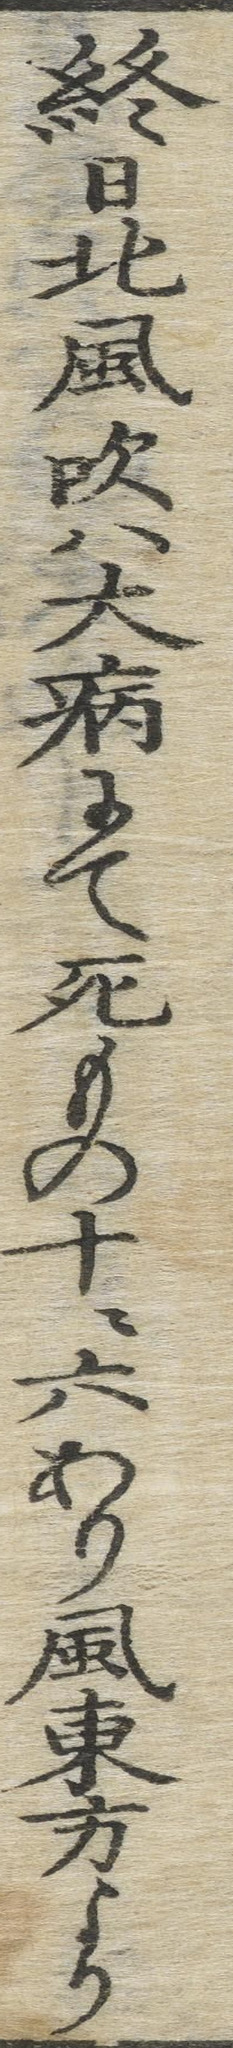終日北風吹は大病にて死もの十〻六あり風東方より
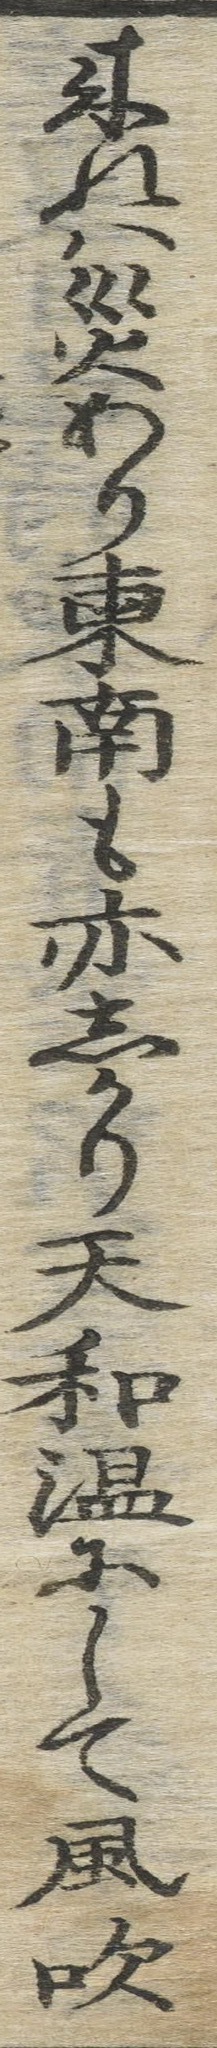来れは災あり東南も亦しかり天和温にして風吹
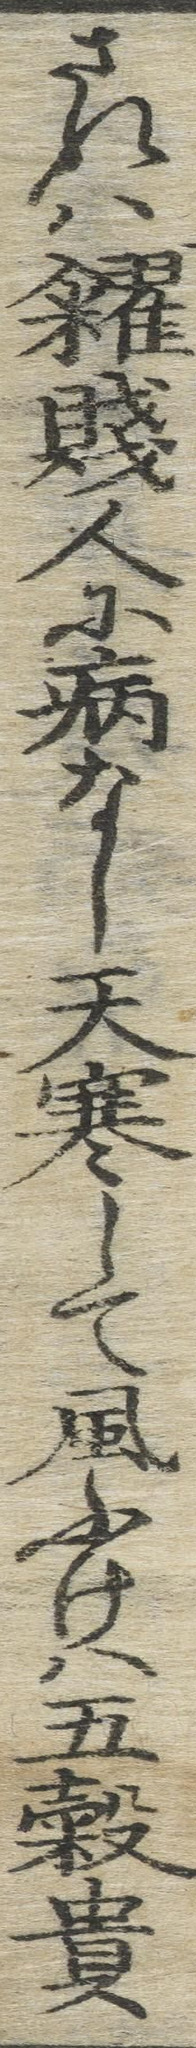されは糴賤人に病なし天寒して風ふけは五穀貴
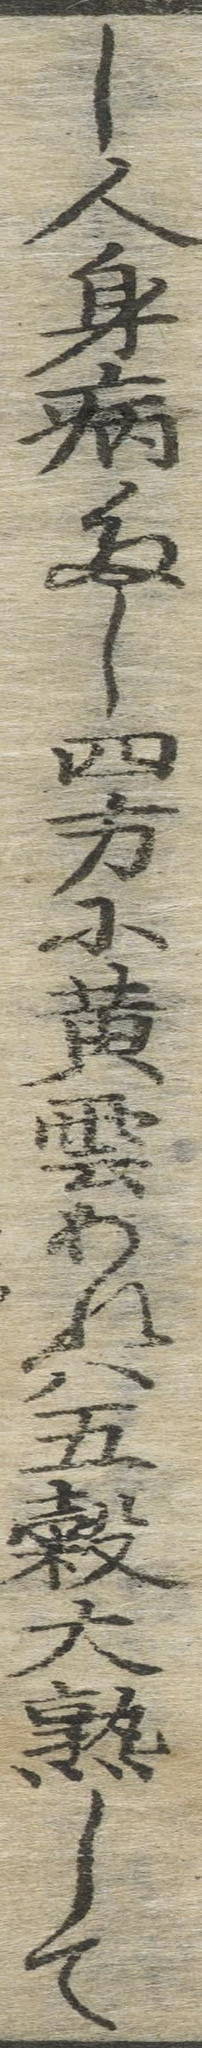し人身病多し四方に黄雲あれは五穀大熟して
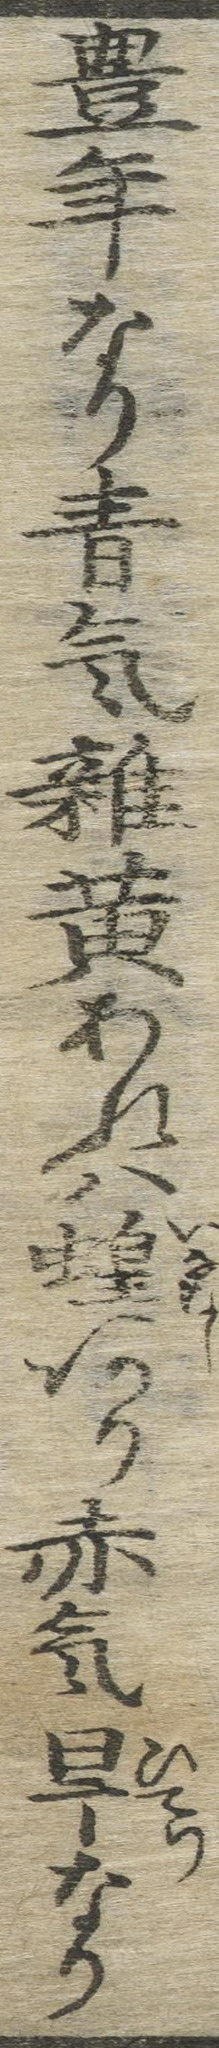豊年なり青気雑黄あれは蝗あり赤気旱なり

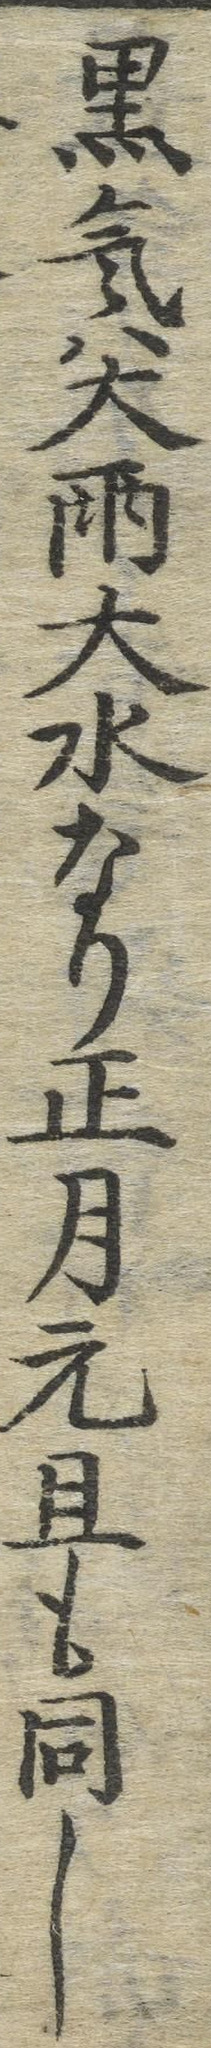黒気は大雨大水なり正月元且も同し
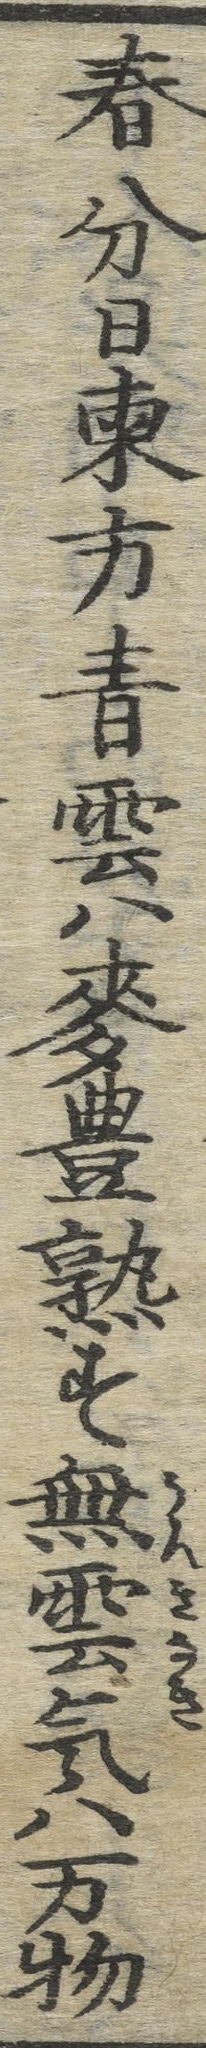春分日東方青雲は麥豊熟す無雲気は万物
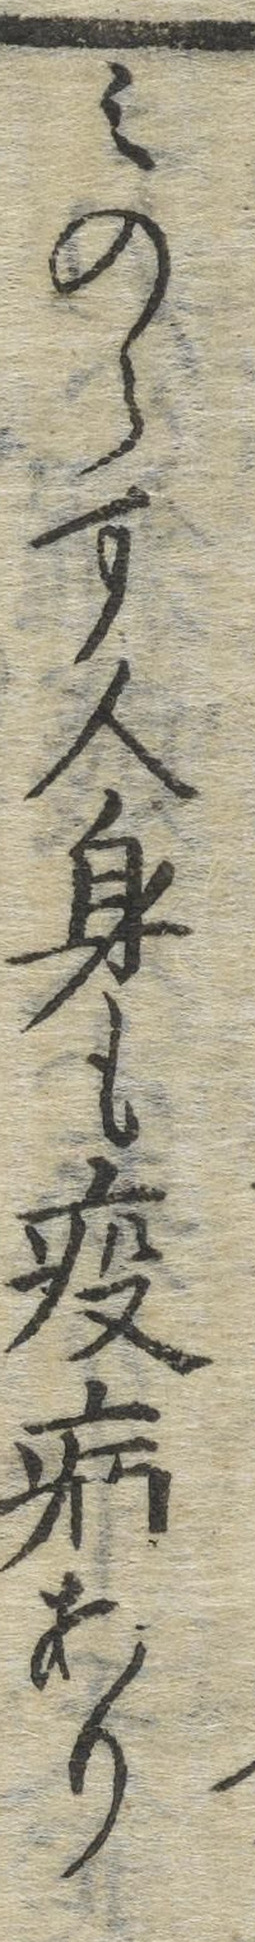みのらす人身も疫病あり
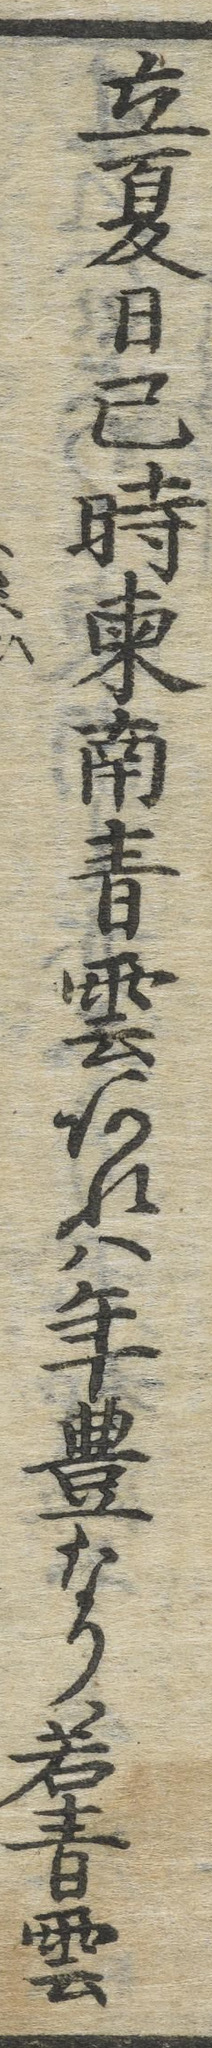立夏日已時東南青雲あれは年豊なり若青雲
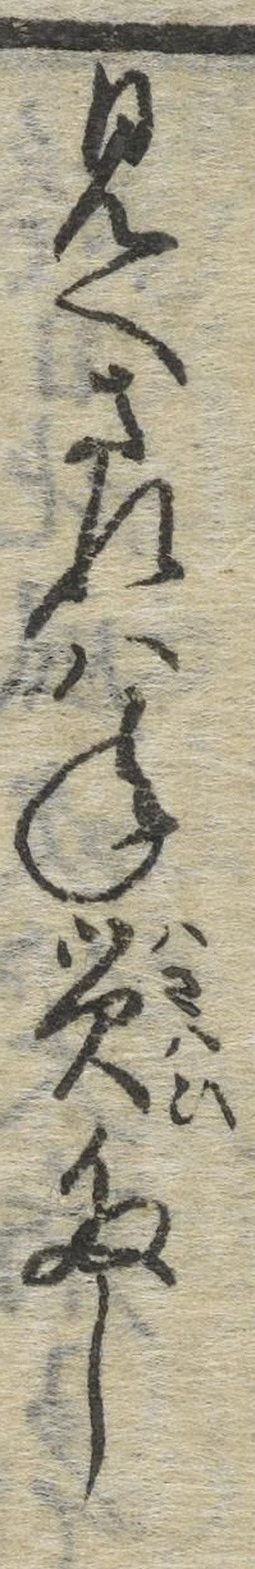見へされは年災多し
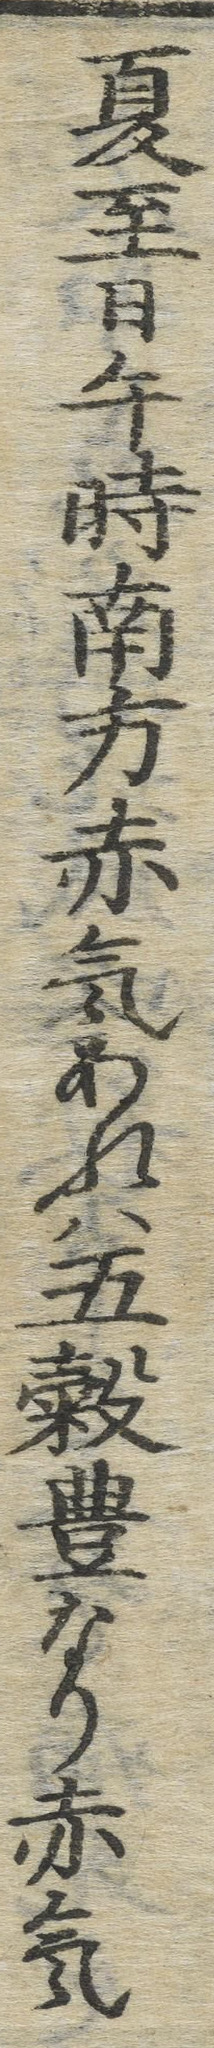夏至日午時南方赤気あれは五穀豊なり赤気
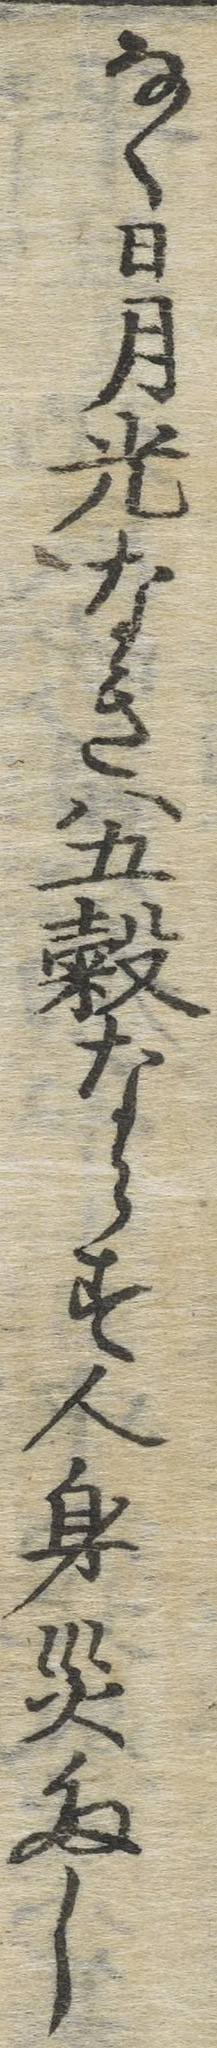なく日月光なきは五穀ならす人身災多し
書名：[晴雨考]
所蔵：東京大学地震研究所図書室 Earthquake Research Institute Library, The University of Tokyo, JAPAN
